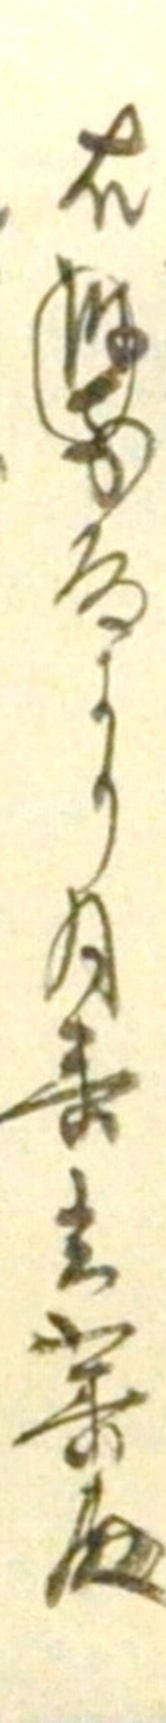右備中殿より月番玄蕃殿
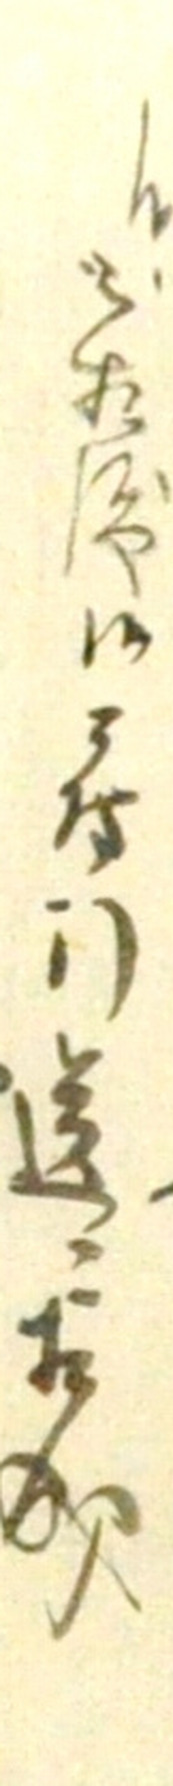え被相渡候に付引送に相成
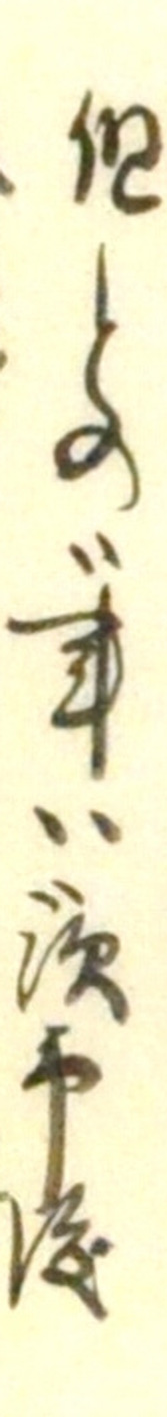但との御事は御次申渡
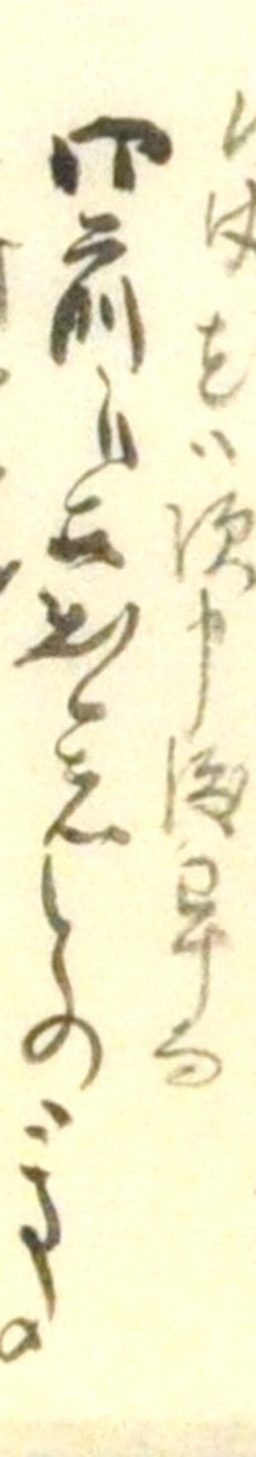御前え罷出候ゑとの御事の
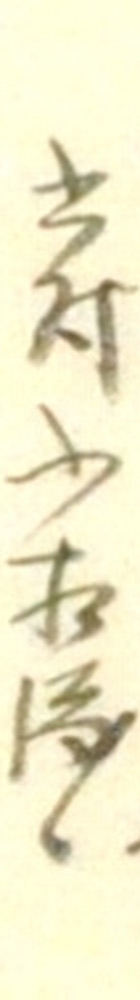書付不相渡候
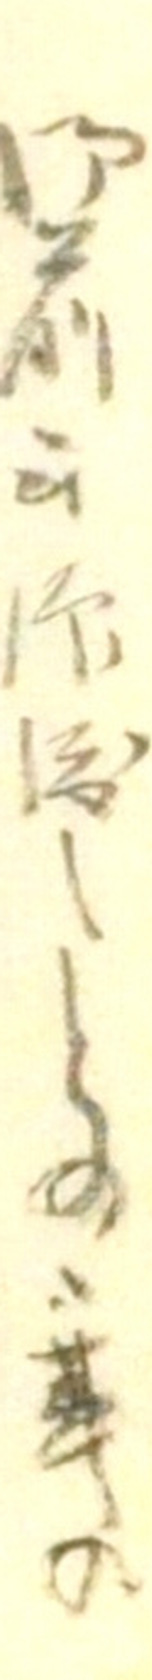御前被仰渡之との御事の
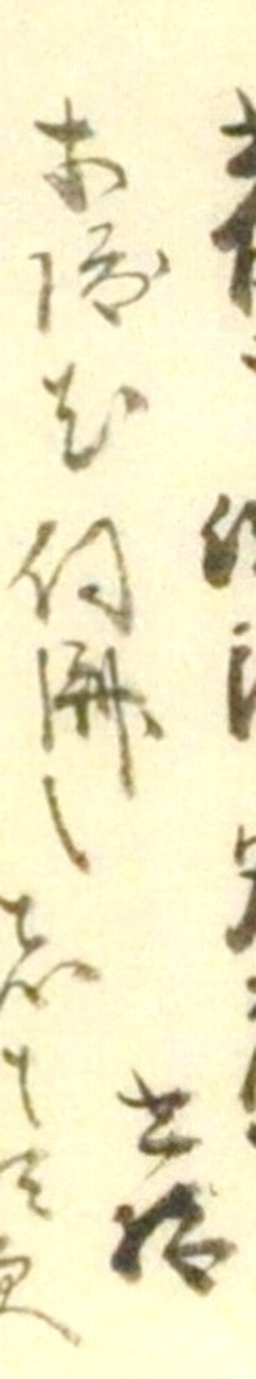相渡尤伺済之者は猶更
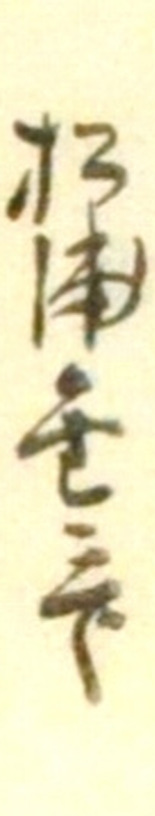松浦金三郎
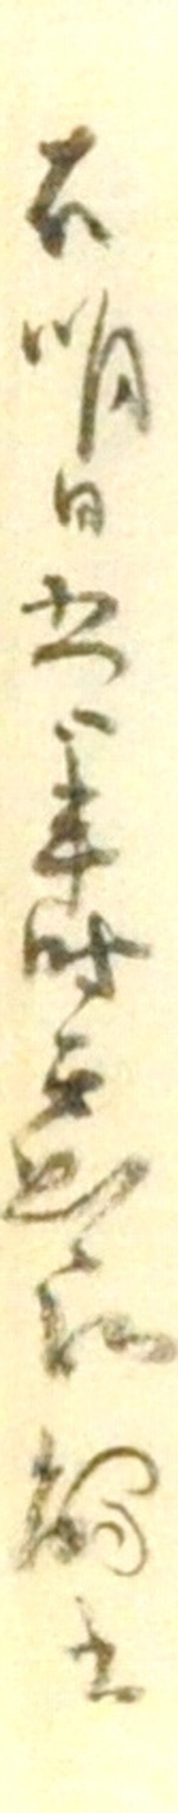右明日五ッ半時罷出候様触書
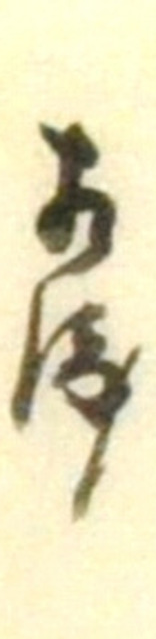相渡候
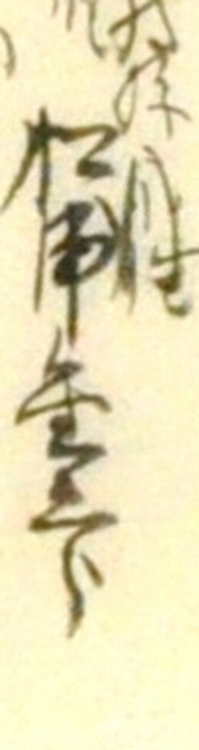松浦金三郎
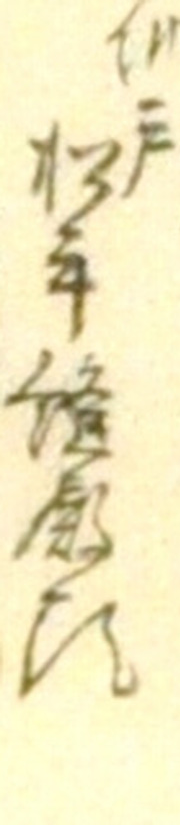松平縫殿頭
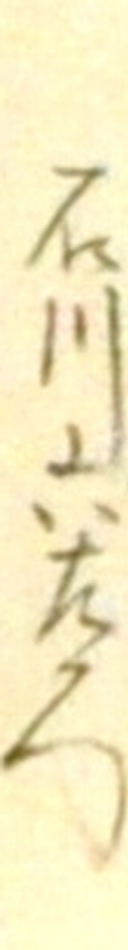石川六左ヱ門
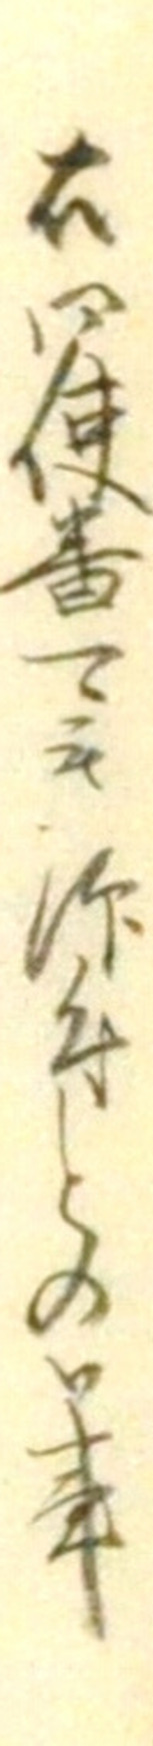右御使番可被仰付との御事
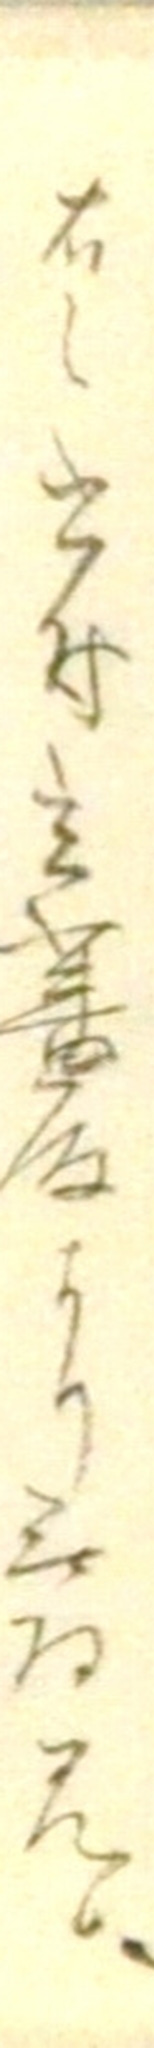右之書付玄蕃殿より無為見候

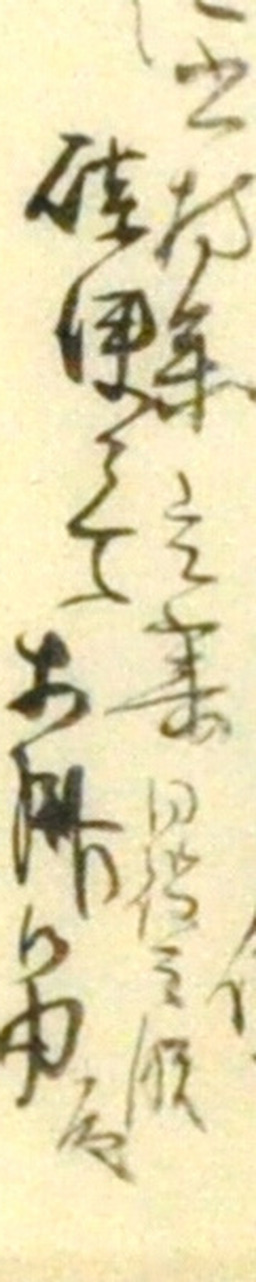えは徒使にて相済候由
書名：万覚
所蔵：伊那市立高遠町図書館・合同会社AMANE
